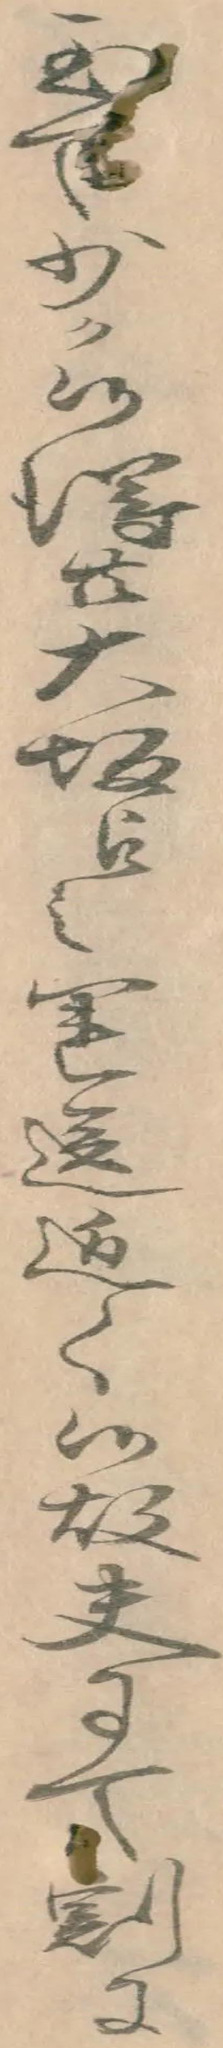至て少く候得共大坂江之運送近く候故夫にて割に
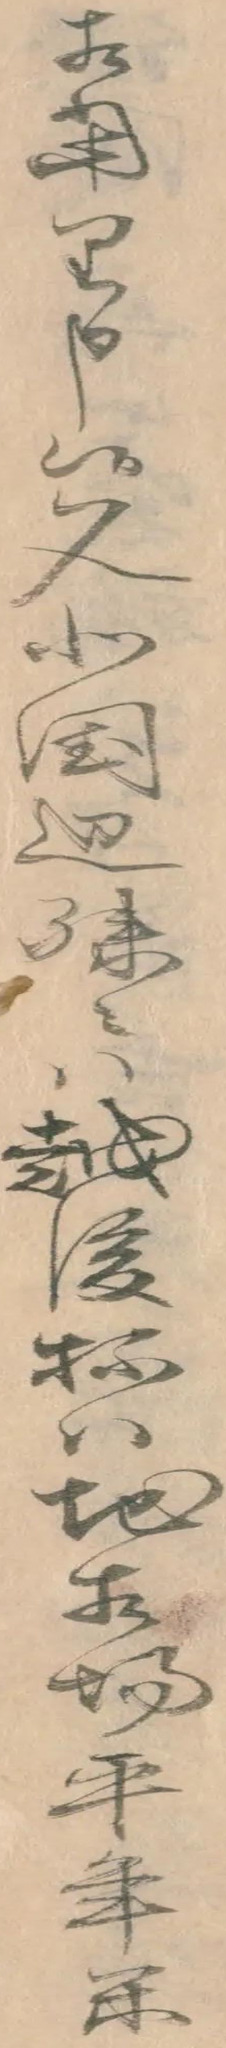相当り申候又北国辺殊には越後抔は地相場平年米
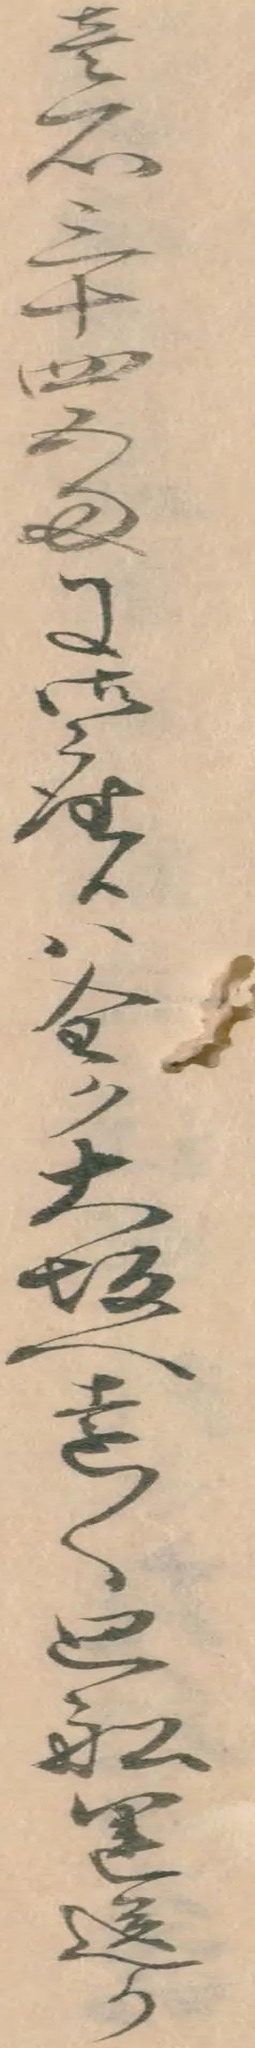壱石三十四五匁に御座候は全く大坂へ遠く廻船運送り
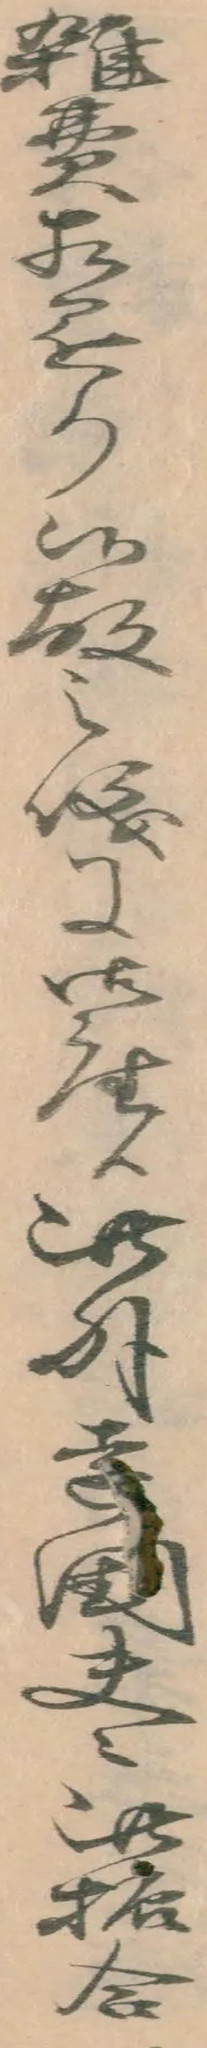雑費相懸り候故之儀に御座候此外遠国夫々此振合
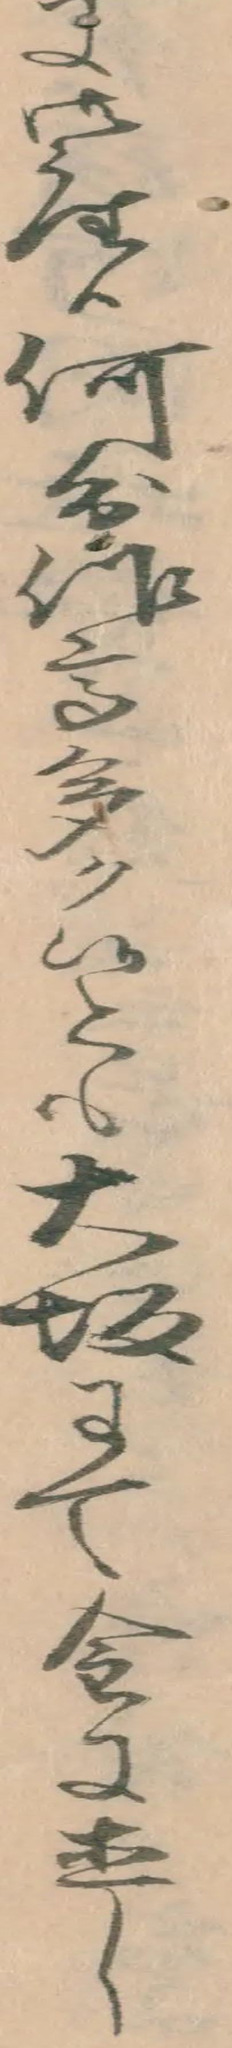に御座候何分作高多く候とも大坂にて金に直し
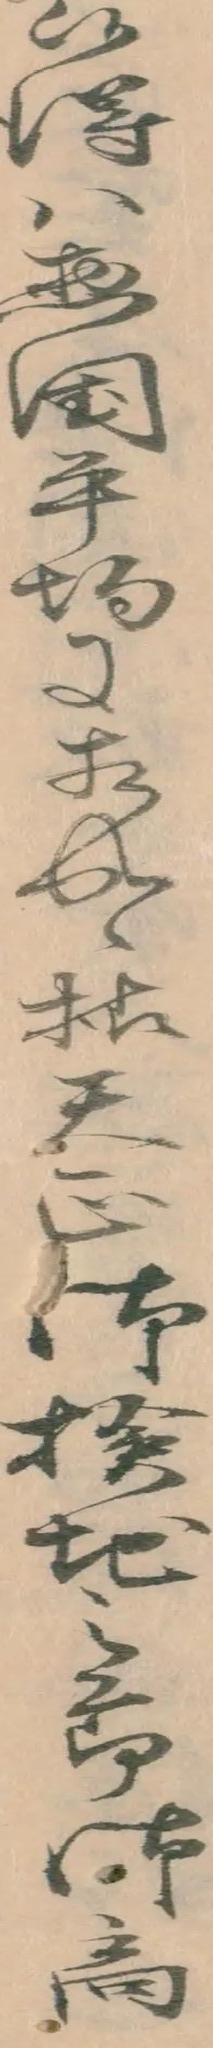候得は惣国平均に相成候様天正御撿地之節御高
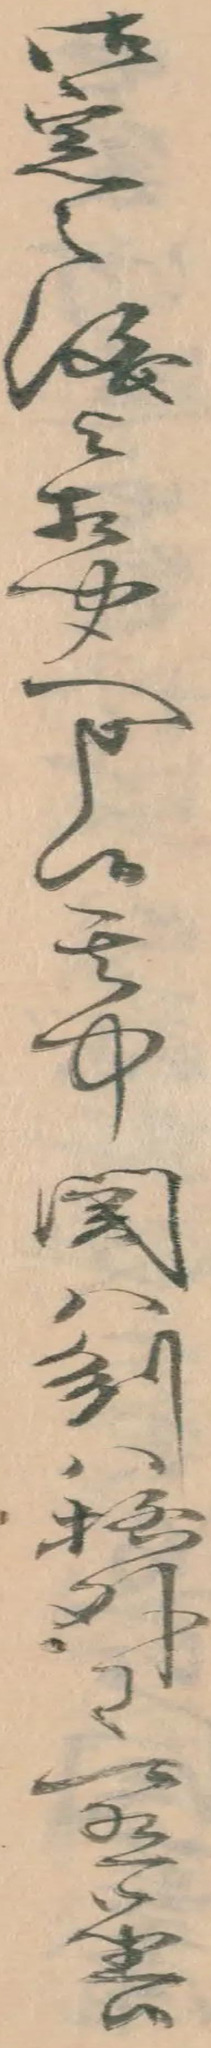御定之儀と相聞へ申候其中関八州は格外に可有御坐候
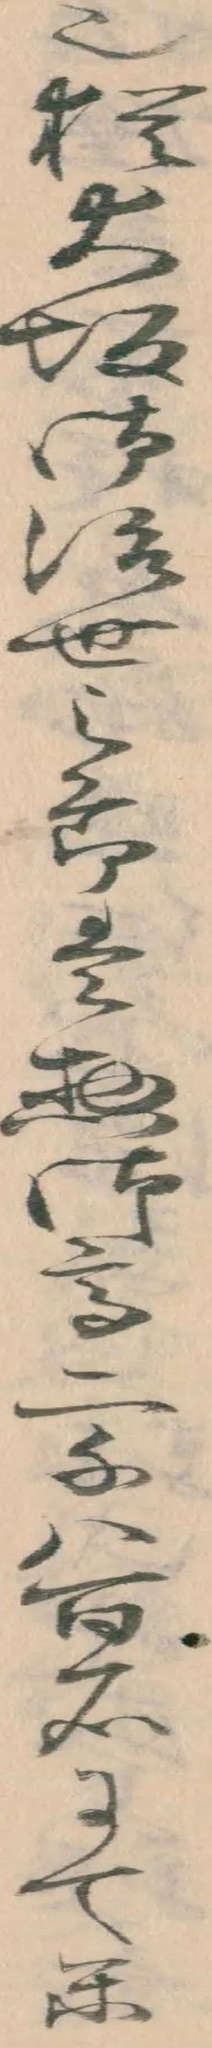也猶大坂御治世之節は惣御高二千八百石にて米
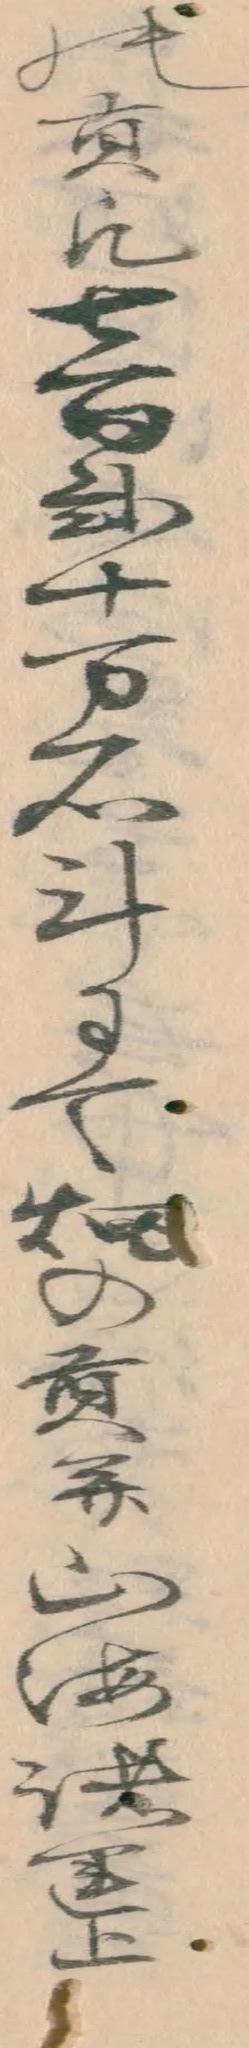の貢凡七百弐十万石計にて畑の貢并山海諸運上
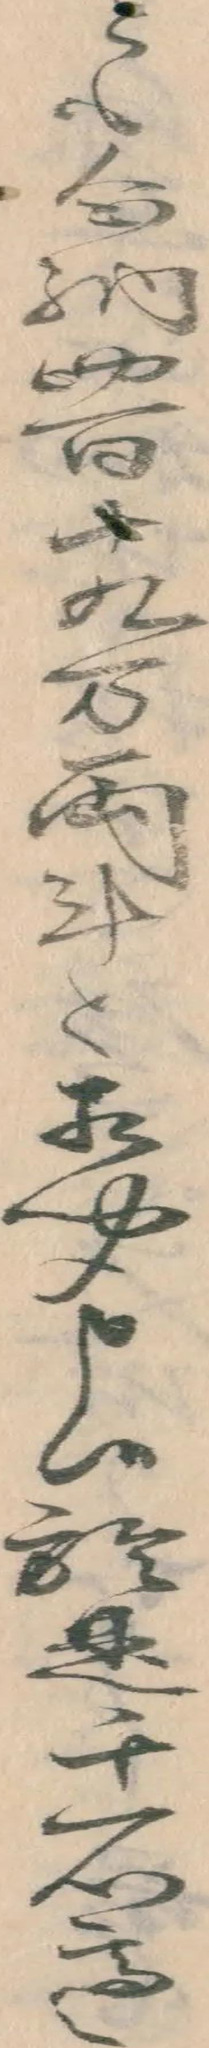とも金納四百十九万両計と相聞申候於是千石高之
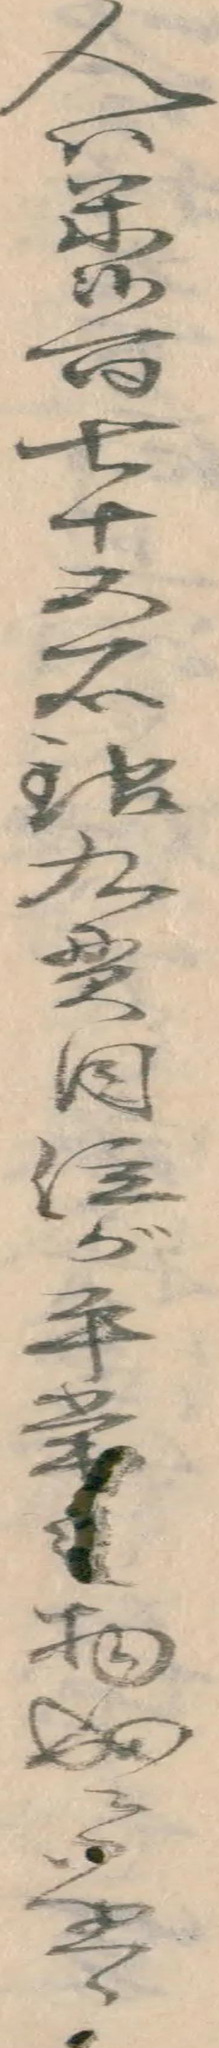人は米貳百七十五石銀九貫目位が平常之物成に御座候
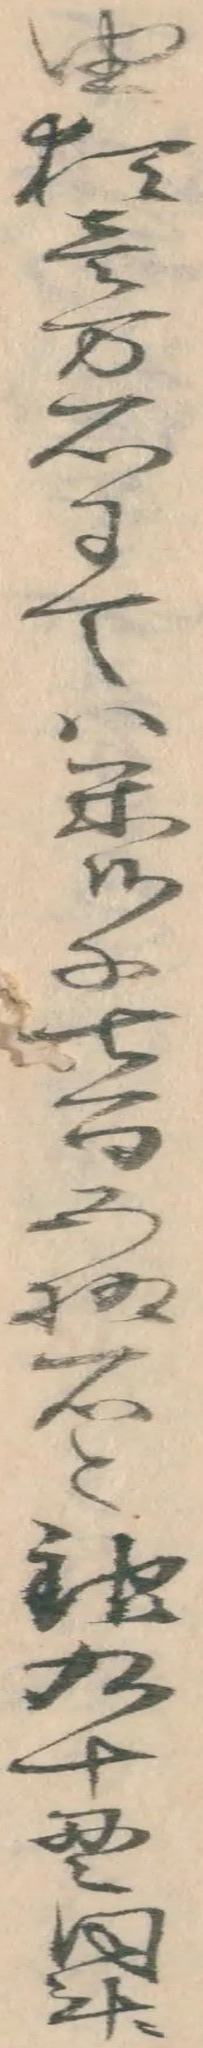由猶壱万石にては米貳千七百五拾石と銀九十貫目計に
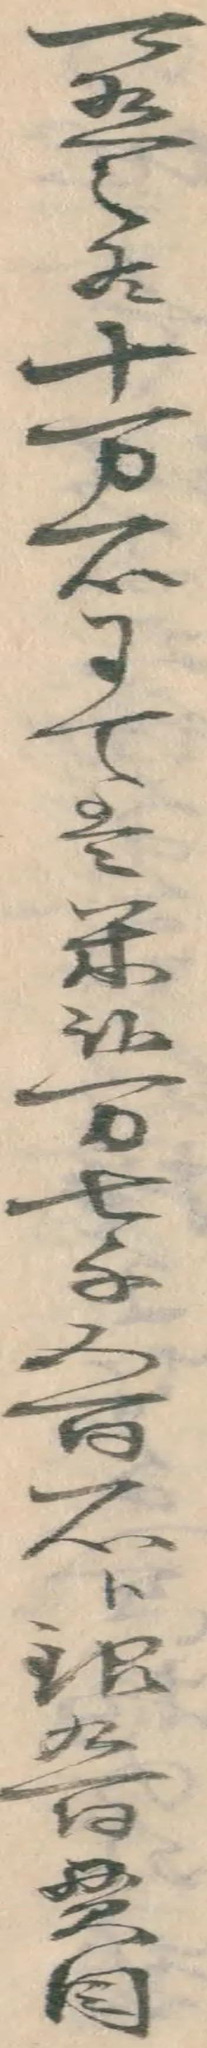可有之各十万石にては米貳万七千五百石と銀九百貫目
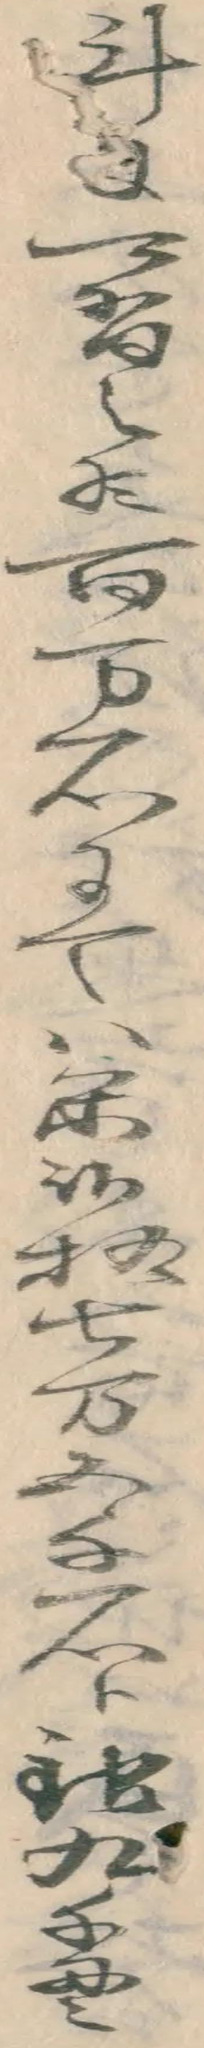計に可有之各百万石にては米貳拾七万五千石と銀九千貫
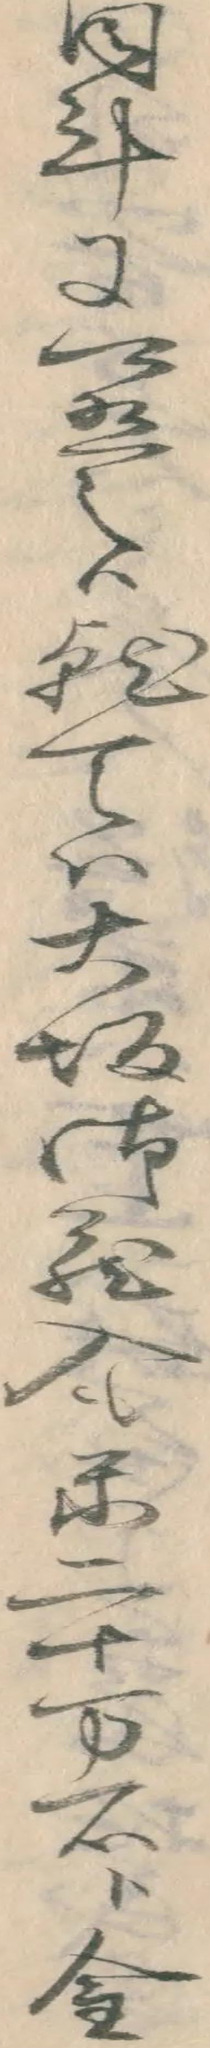目計に可有之候就ては大坂御蔵入も米二十万石と金
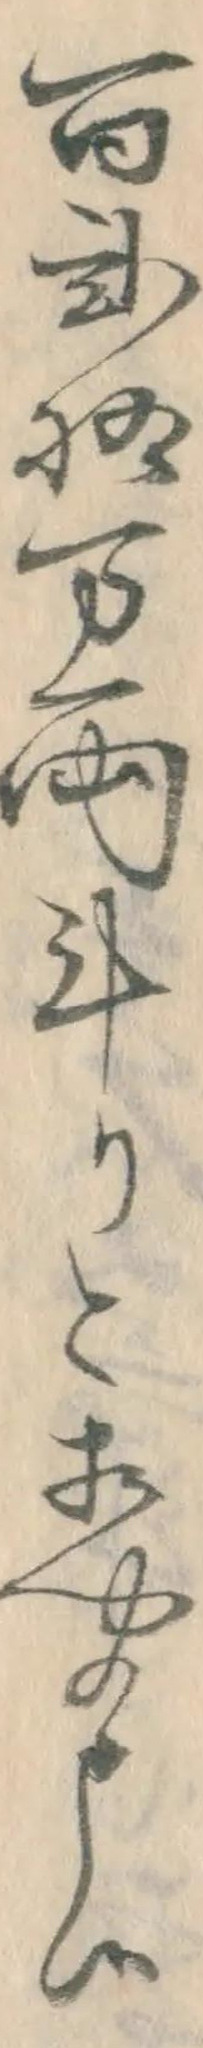百貳拾万両計りと相聞申候
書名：斎庭之穂
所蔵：国立国会図書館 National Diet Library, JAPAN
